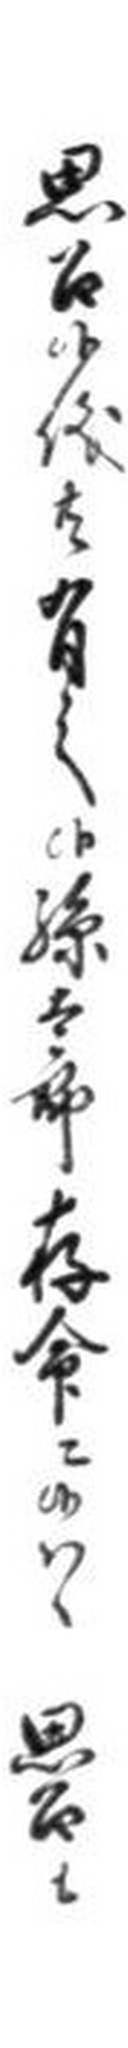思召候儀共有之候孫太郎存命ニ候ハヽ思召も
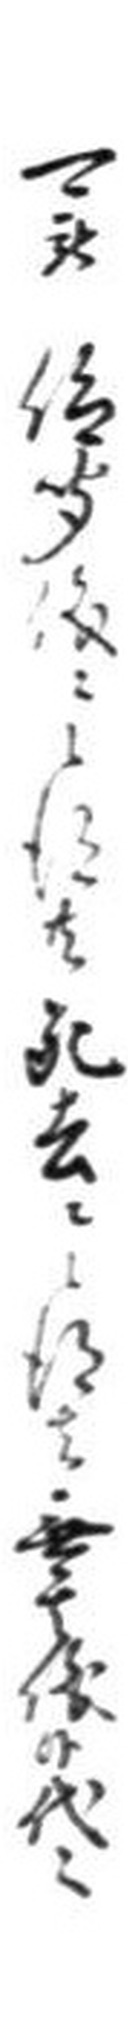可被仰聞儀ニ候得共死去ニ候得者無其儀候代々
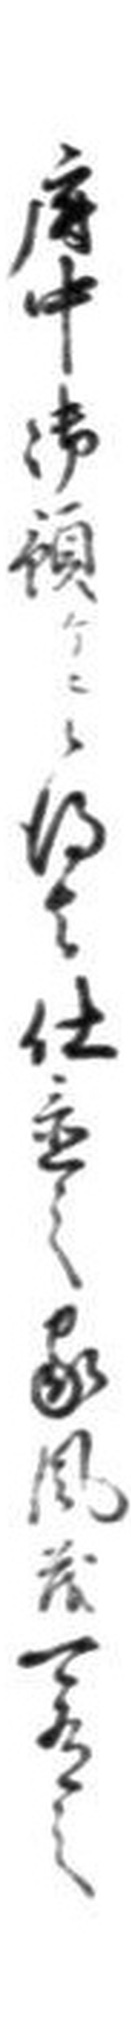府中御預ケニ候得者仕置之家風茂可有之
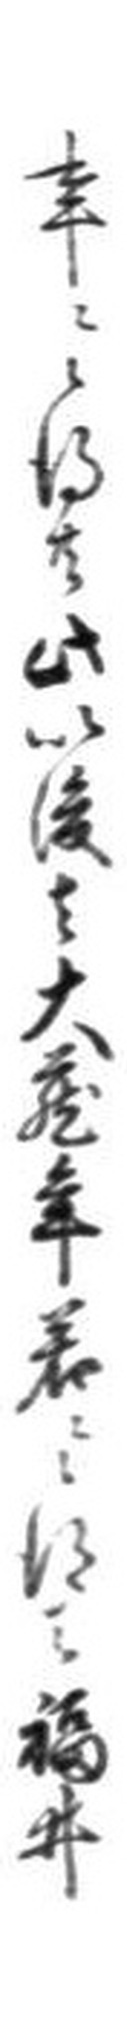事ニ候得共以後者大蔵年若ニ候得者福井
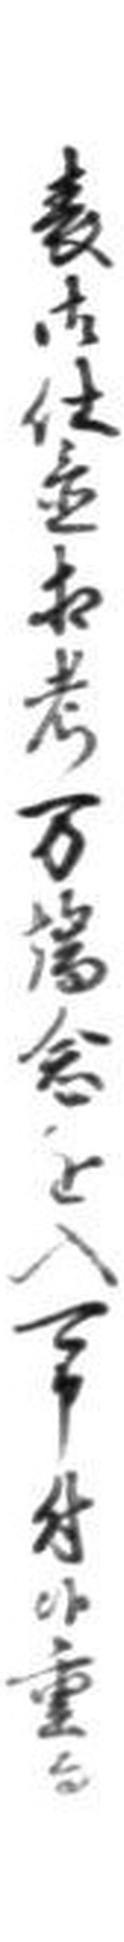表御仕置相考万端念を入可申付候重而
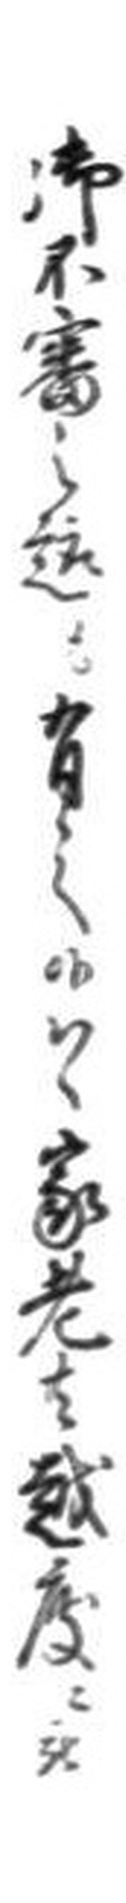御不審之趣も有之候ハヽ家老共越度ニ被
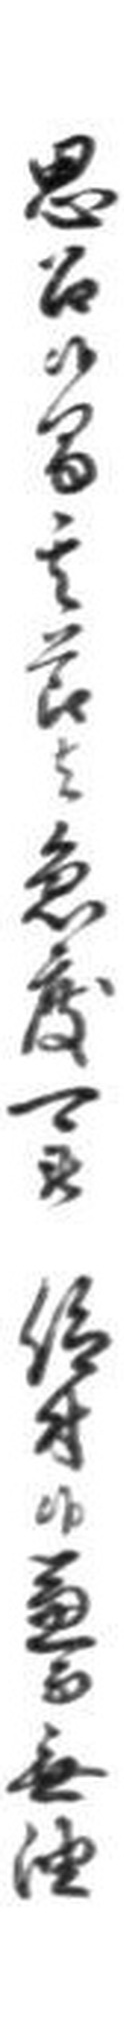思召候間其節者急度可被仰付候兼而無油
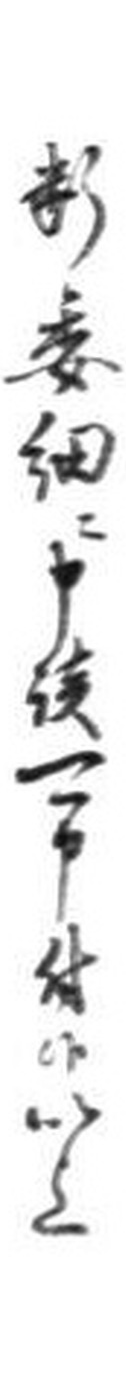断委細ニ申談可申付候以上
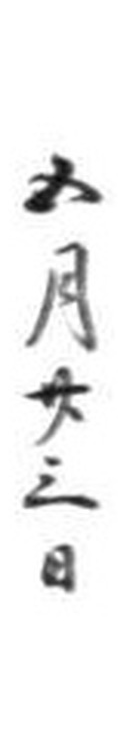五月廿三日
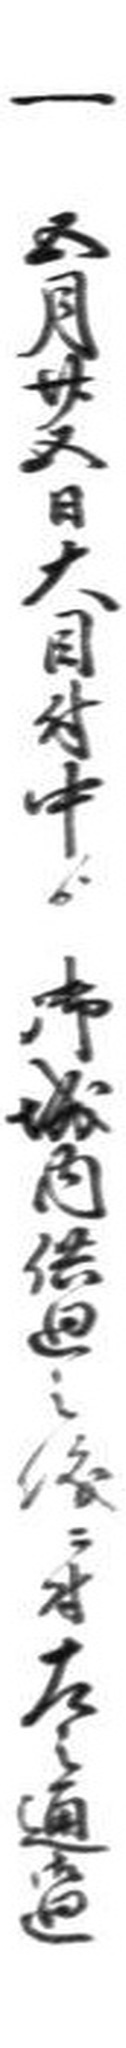一五月廿五日大目付中ゟ御城内供廻之儀ニ付左之通御廻

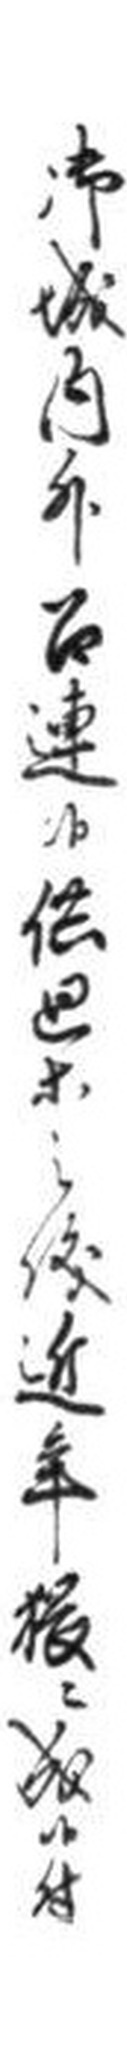御城内外召連候供廻等之儀近年猥ニ成候付
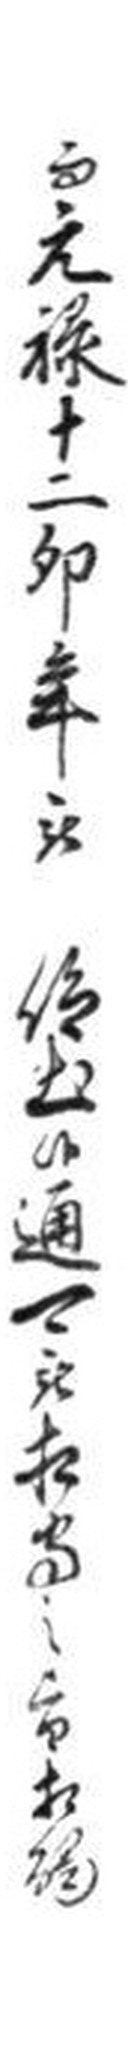而元禄十二卯年被仰出候通可被相守之旨相触
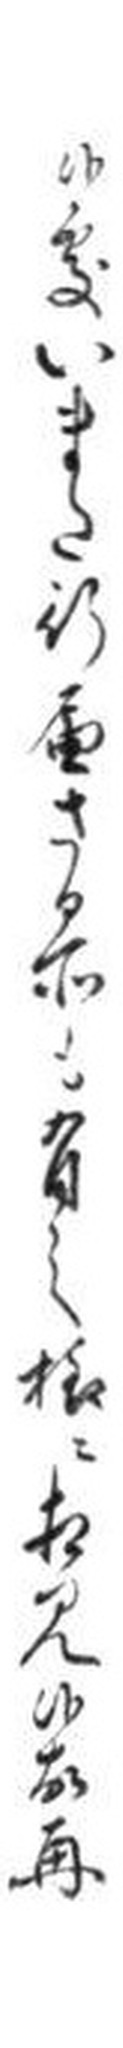候処いまた行届さる所も有之様ニ相見候故再
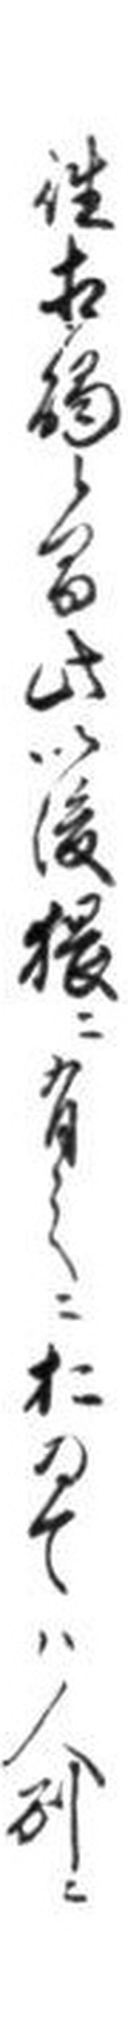往相触候間此以後猥ニ有之ニおゐてハ人別ニ
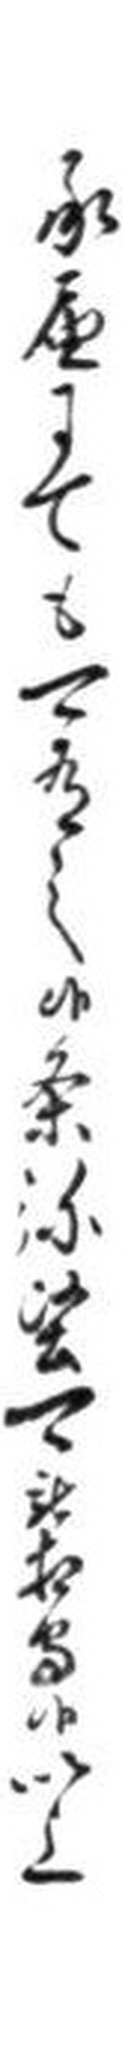承届にても可有之候条弥堅可被相守候以上
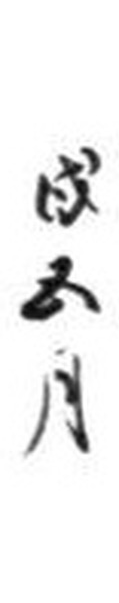戌五月
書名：家譜 三十二 吉邦公 従享保二年到享保三年
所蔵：福井県文書館 Fukui Prefectural Archives
